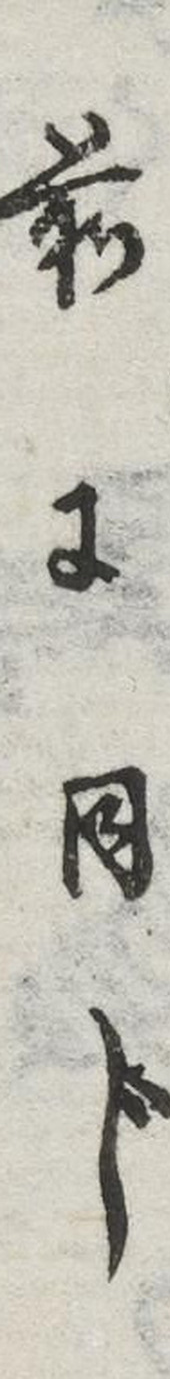前に同じ
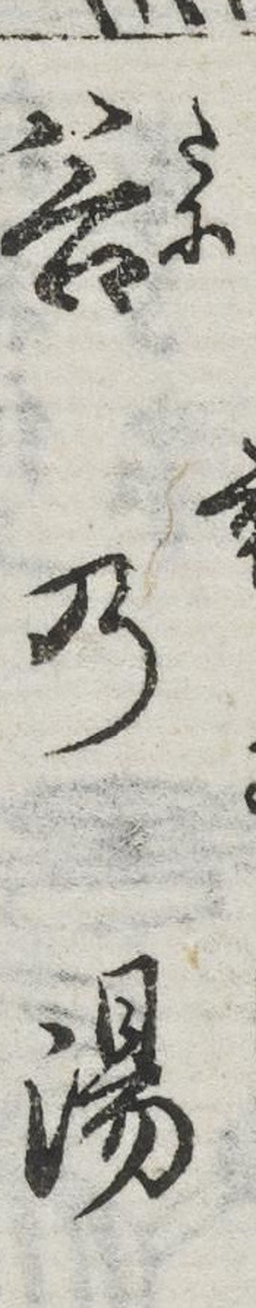谷の湯
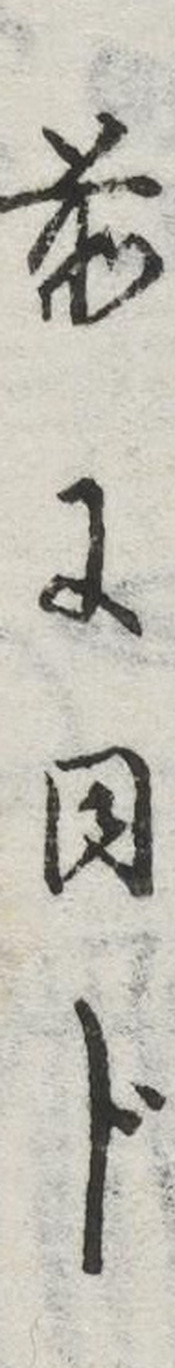前に同じ
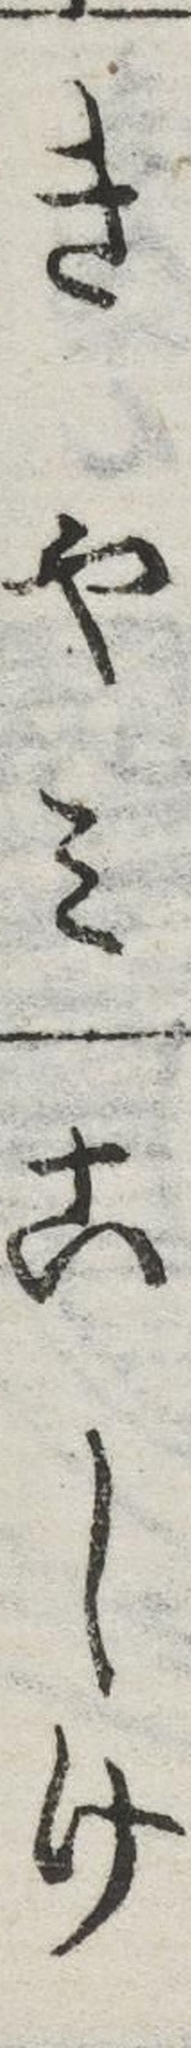きやみこしけ
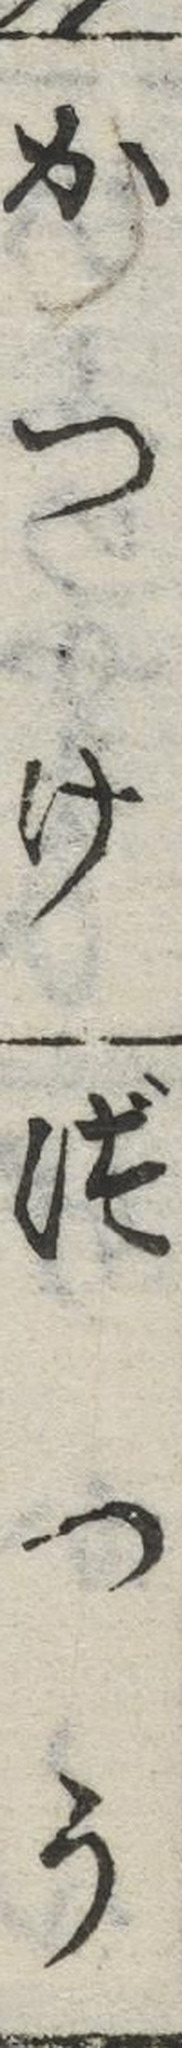かつけづつう
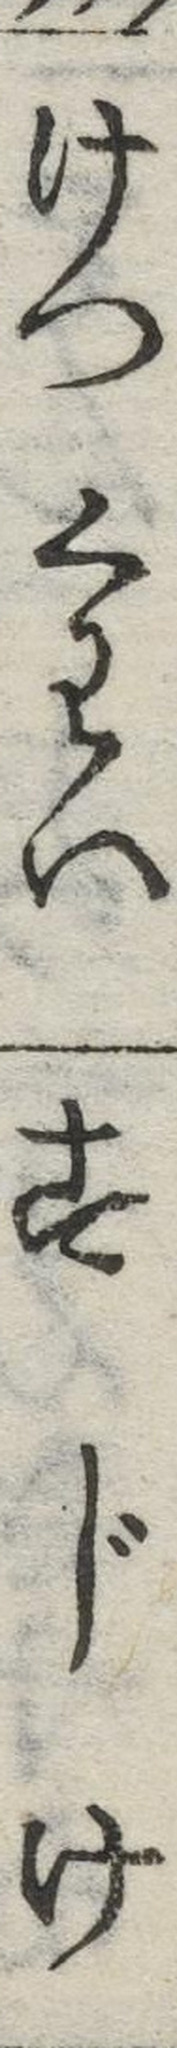けつくわいすじけ
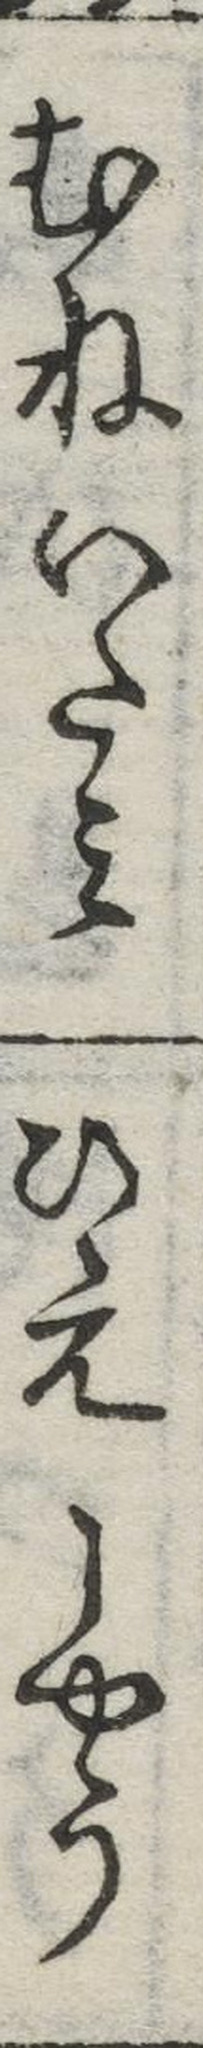むねいたみひえしやう
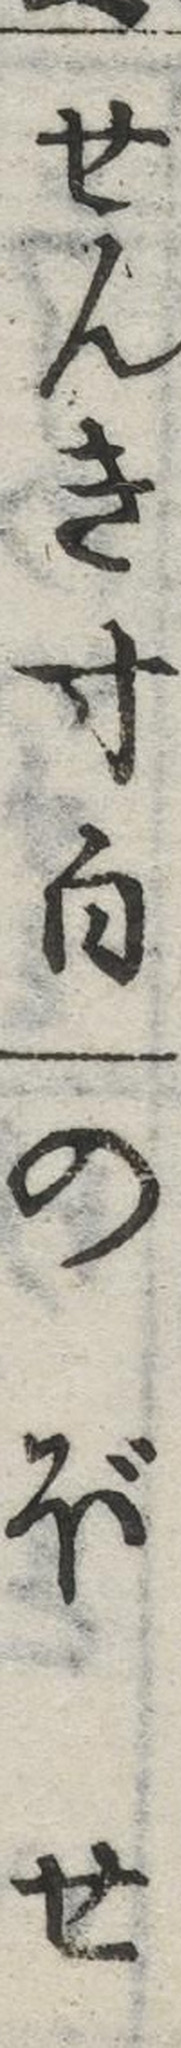せんき寸白のぼせ
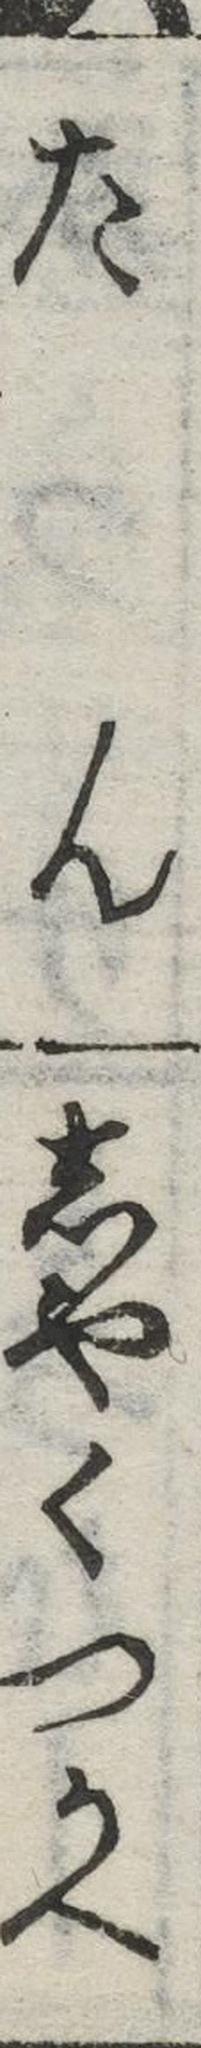たんしやくつかへ
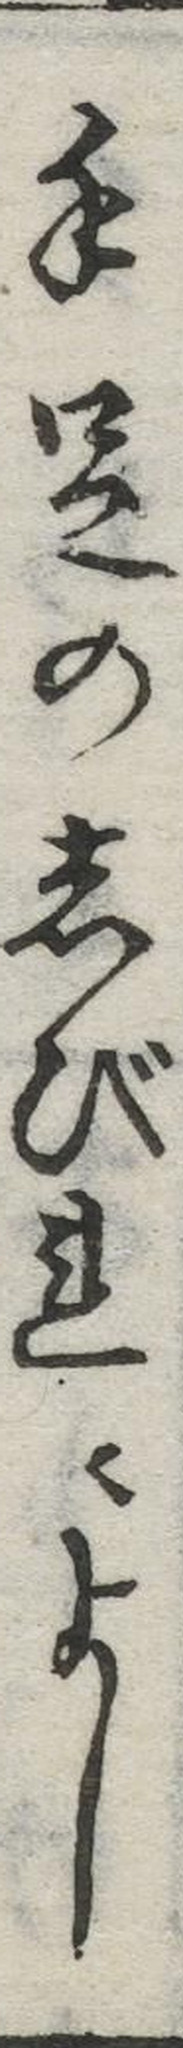手足のしびれによし
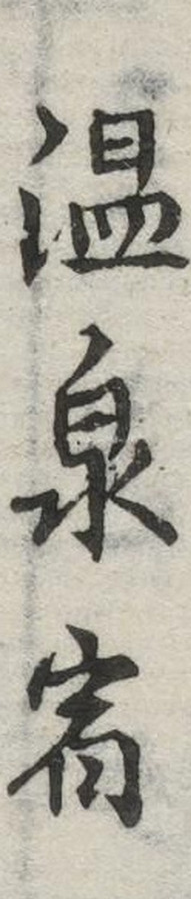温泉宿
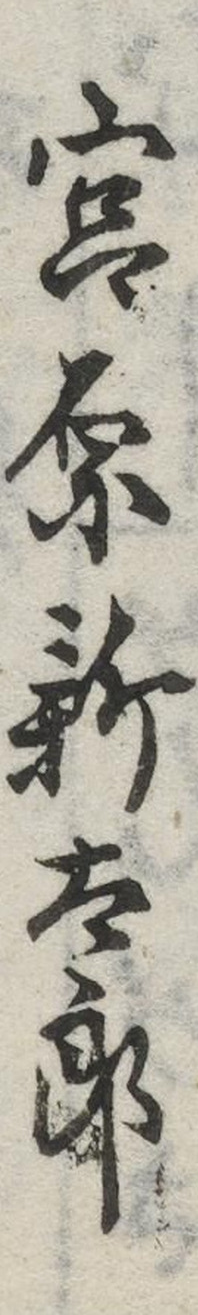宮原新太郎
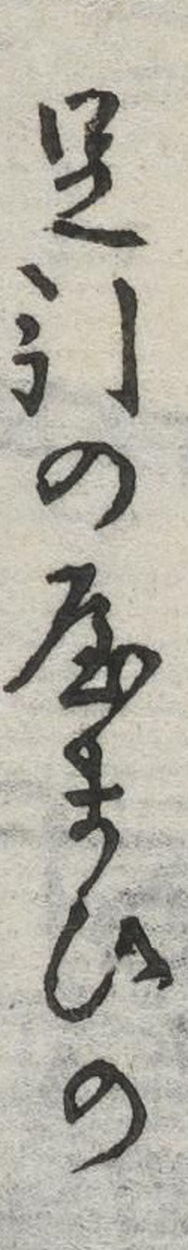足引のやまひの
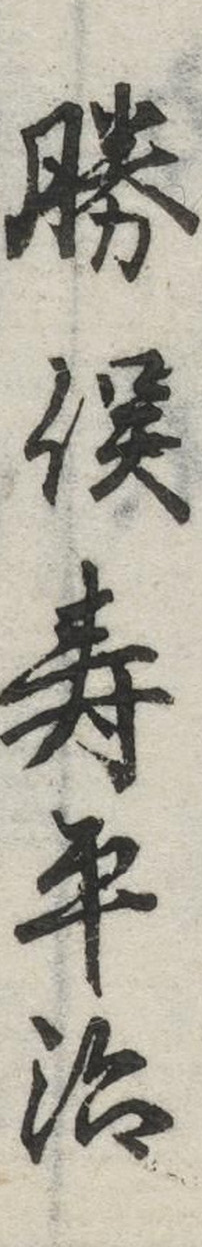勝俣寿半治
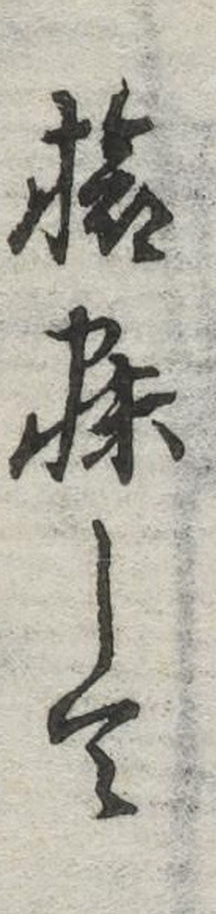旅寝して
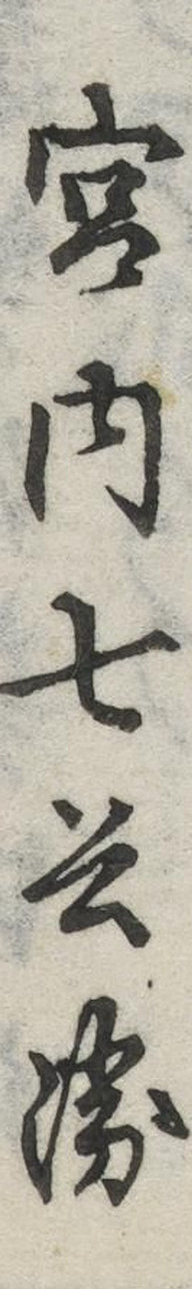宮内七兵衛
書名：諸國温泉遊覽記　全
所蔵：東京大学地震研究所図書室 Earthquake Research Institute Library, The University of Tokyo, JAPAN
